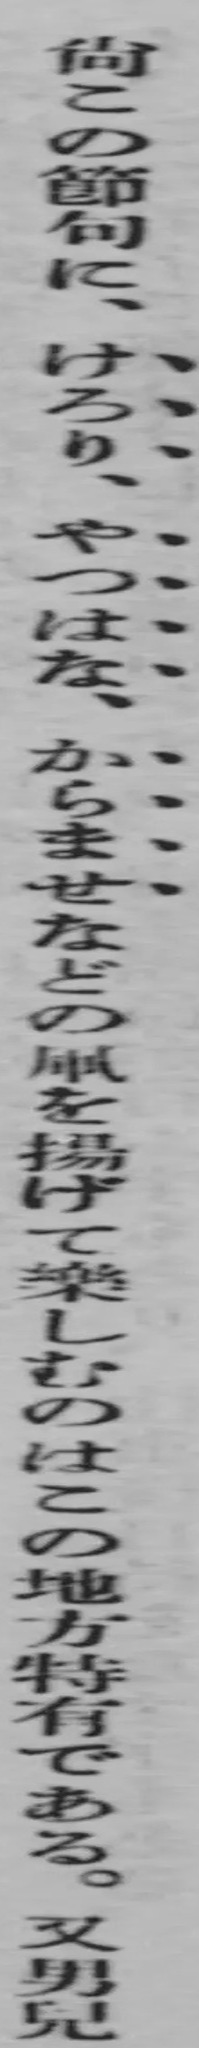尚この節句に、けろり、やつはな、からませなどの凧を揚げて樂しむのはこの地方特有である。又男兒
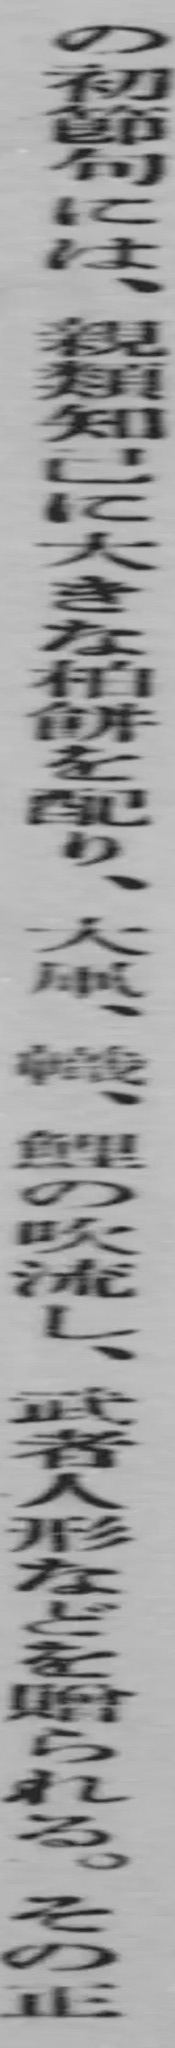の初節句には、親類知己に大きな柏餅を配り、大凧、幟、鯉の吹流し、武者人形などを贈られる。その正
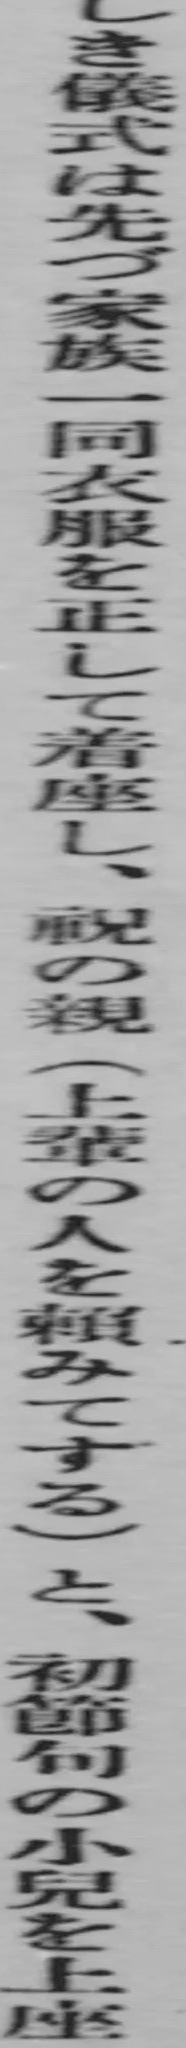しき儀式は先づ家族一同衣服を正して着座し、祝の親(上輩の人を賴みてする)と、初節句の小兒を上座
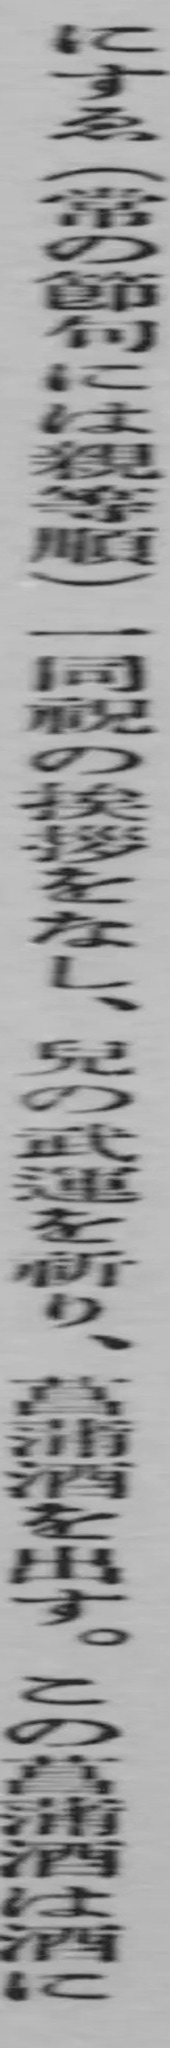にすゑ(常の節句には親等順)一同祝の挨拶をなし、兒の武運を祈り、菖蒲酒を出す。この菖蒲酒は酒に
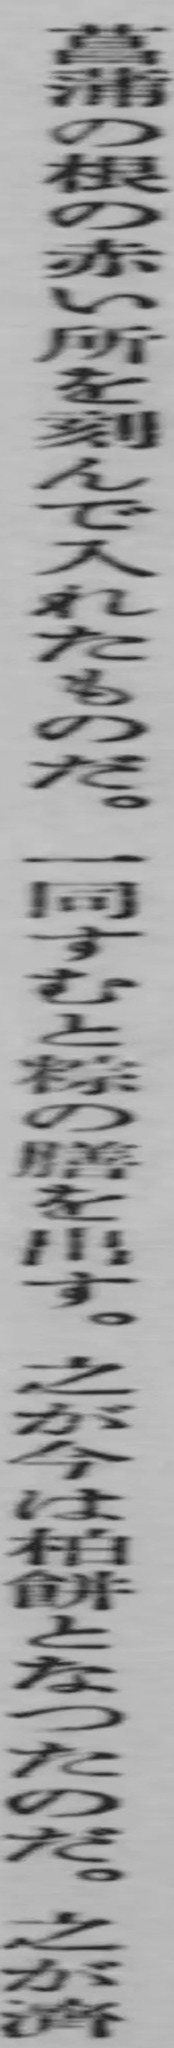菖蒲の根の赤い所を刻んで入れたものだ。一同すむと粽の膳を出す。之が今は柏餅となつたのだ。之が濟
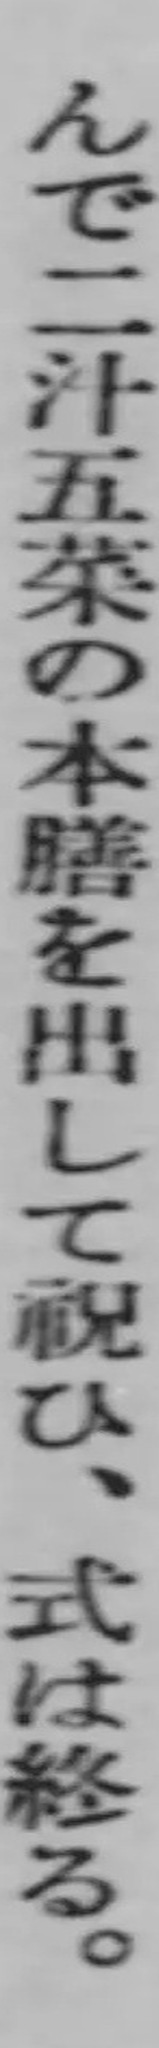んで二汁五菜の本膳を出して祝ひ、式は終る。
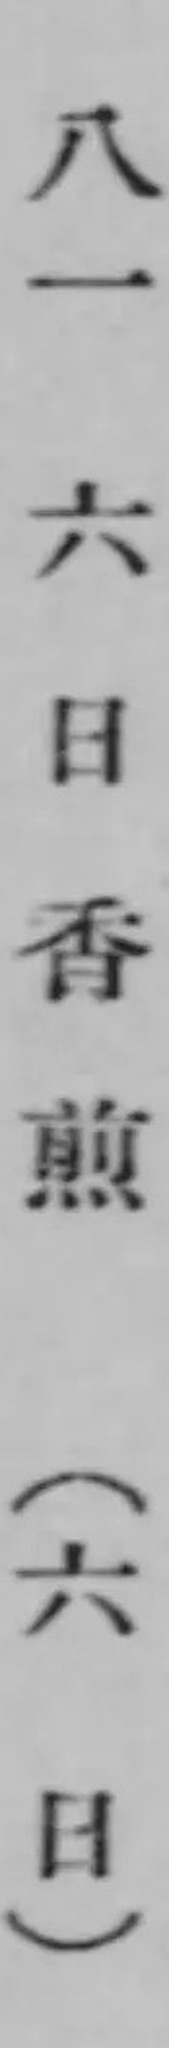八一六日香煎(六日)
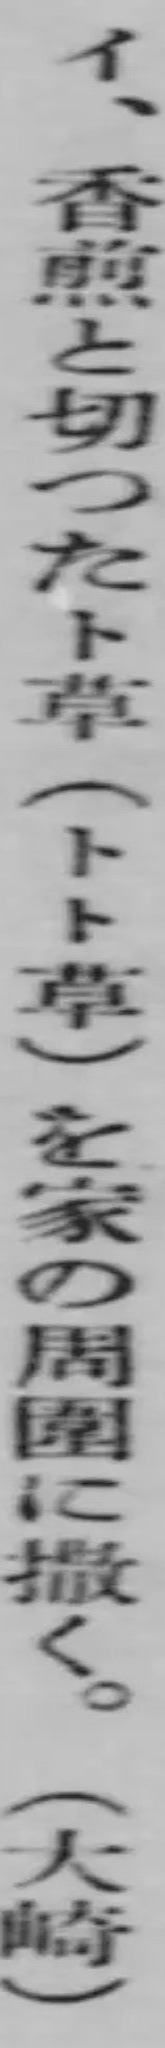イ、香煎と切つたト草(トト草)を家の周圍に撒く。(大崎)
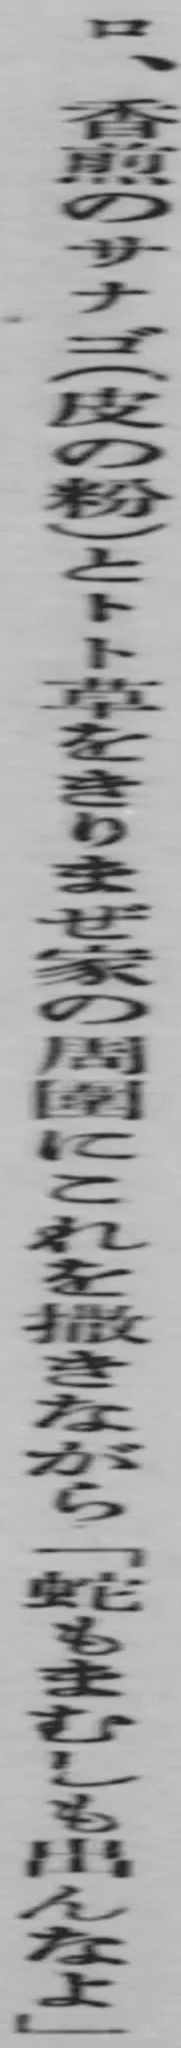ロ、香煎のサナゴ(皮の粉)とトト草をきりまぜ家の周圍にこれを撒きながら「蛇もまむしも出んなよ」
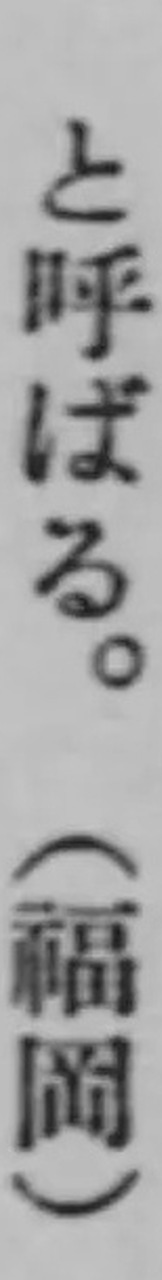と呼ばる。(福岡)
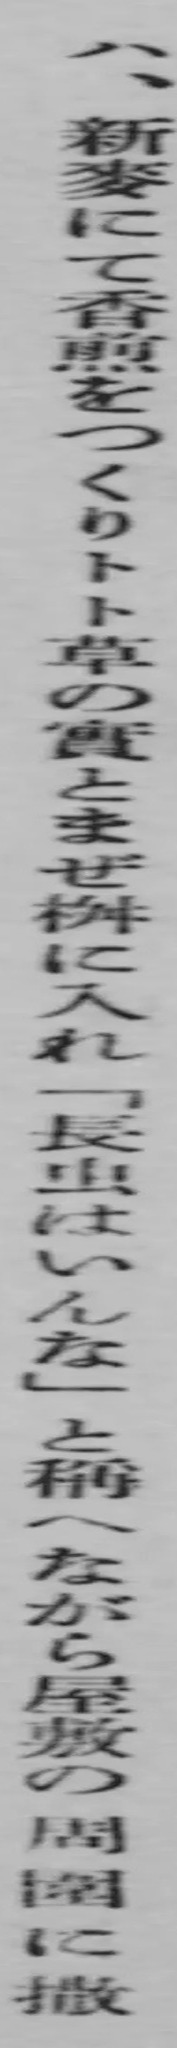ハ、新麥にて香煎をつくりトト草の實とまぜ桝に入れ「長虫はいんな」と稱へながら屋敷の周圍に撒
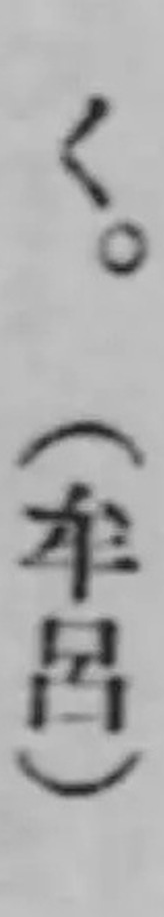く。(牟呂)
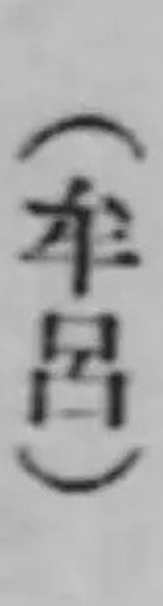牟呂)
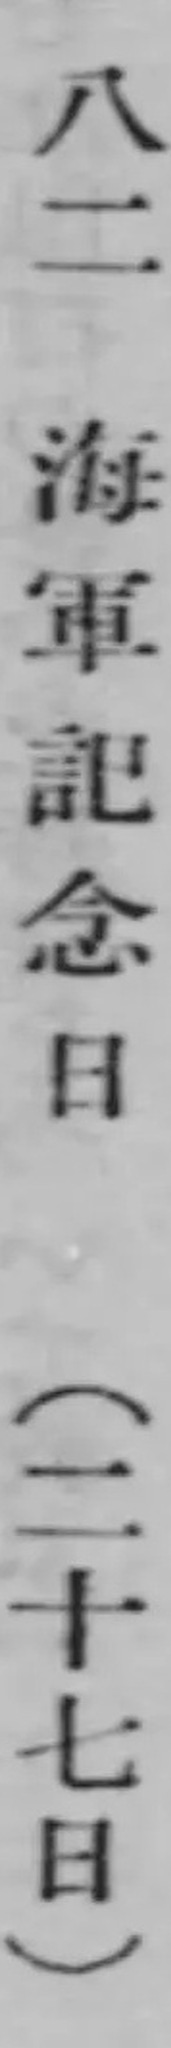八二海軍記念日(二十七日)
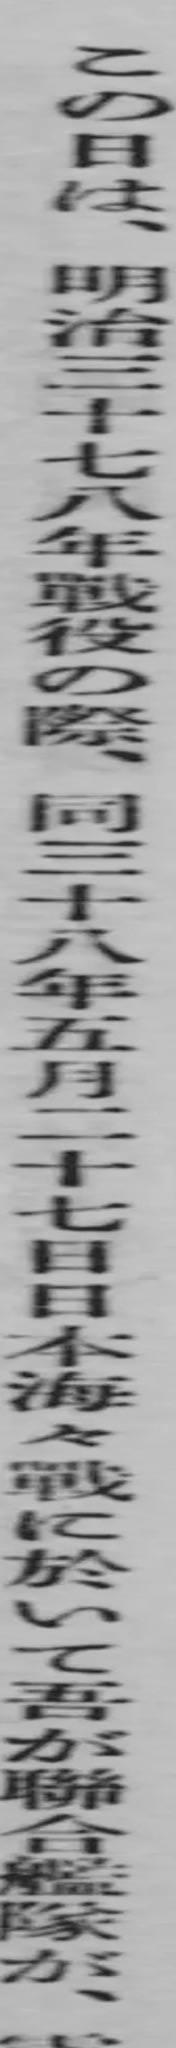この日は、明治三十七八年戰役の際、同三十八年五月二十七日日本海々戰に於いて我が聯合艦隊が、露
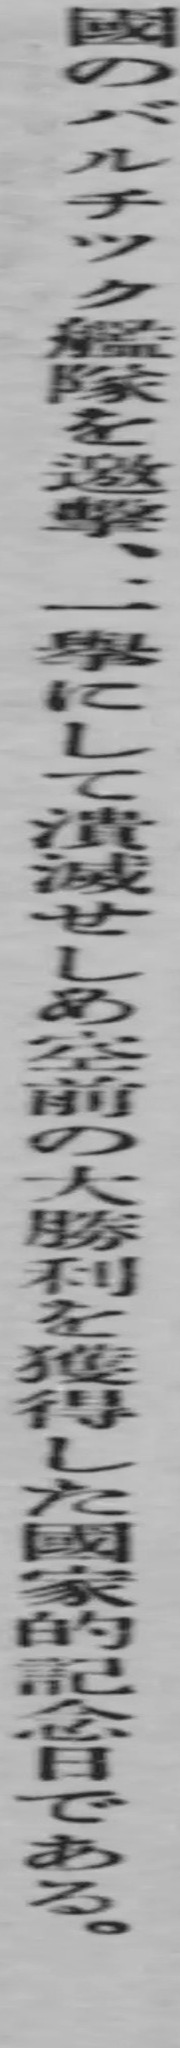國のバルチツク艦隊を邀撃、一擧にして潰滅せしめ空前の大勝利を獲得した國家的記念日である。
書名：豊橋の年中行事
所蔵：国立国会図書館 National Diet Library, JAPAN
